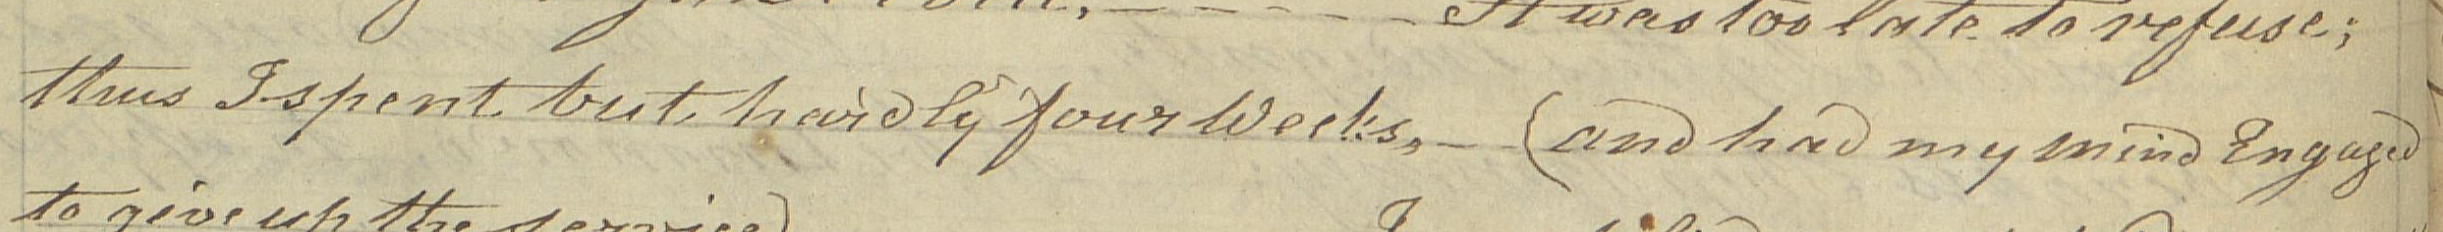thus I spent but hardly four Weeks, (and had my mind Engaged
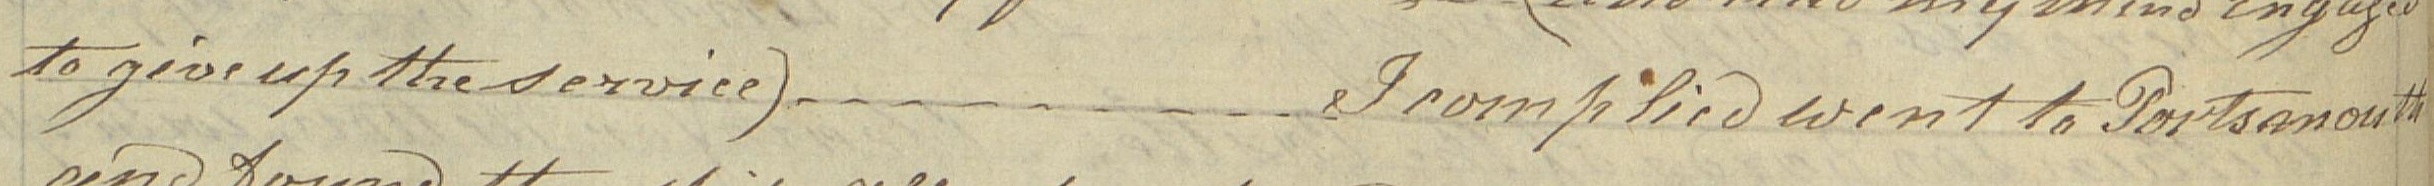to give up the service) I complied went to Portsmouth
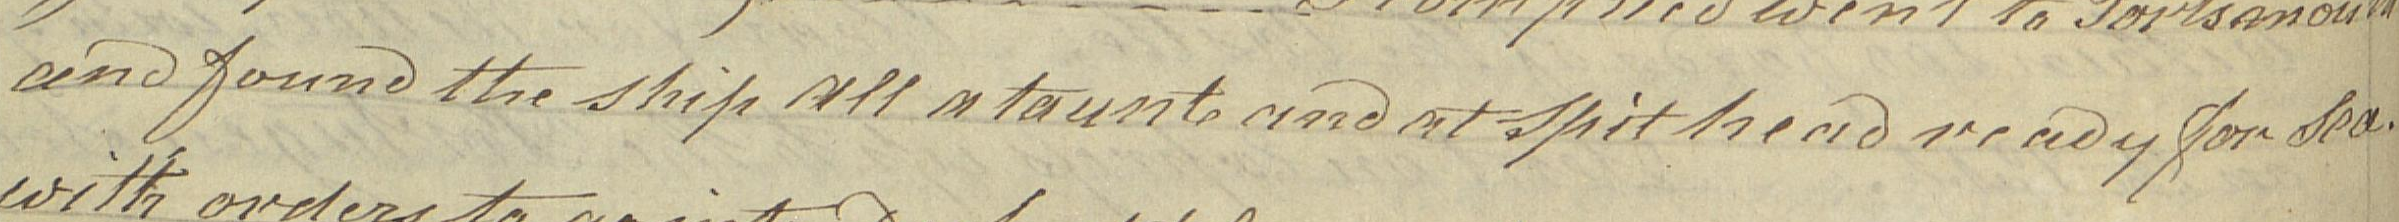and found the ship all a taunt and at spit head ready for Sea.
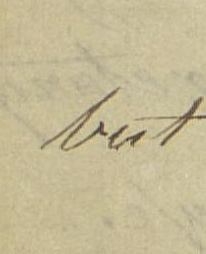but
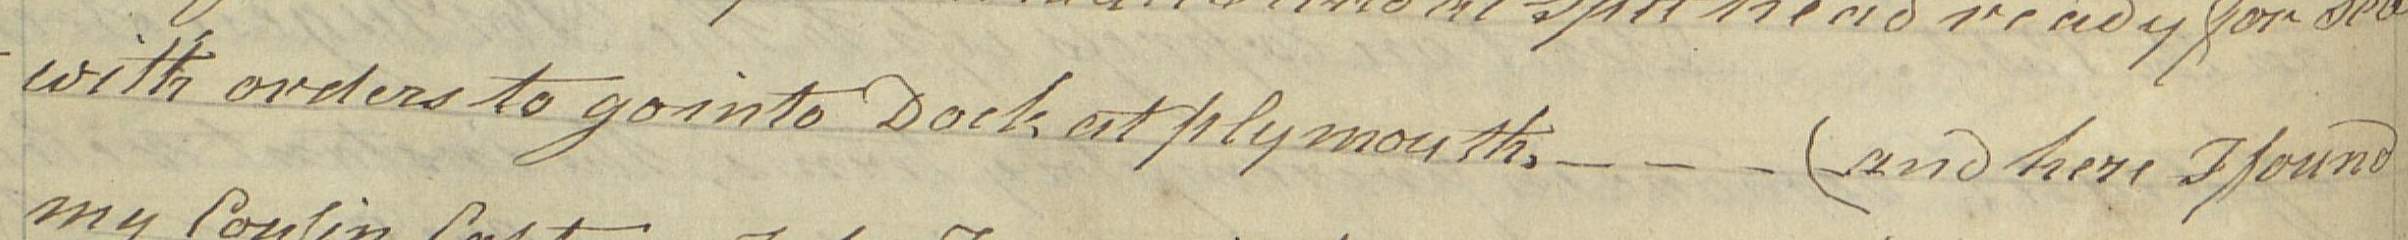with orders to goin to Dock at plymouth, (and here I found
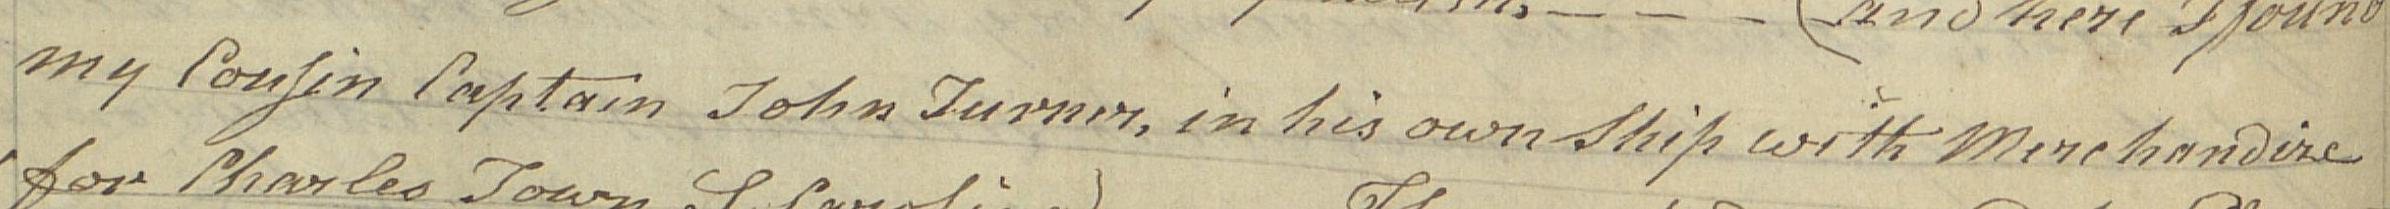My Cousin Captain John Turner, in his own ship with Merchandize
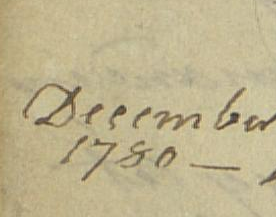December
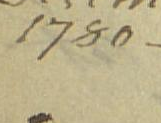1780
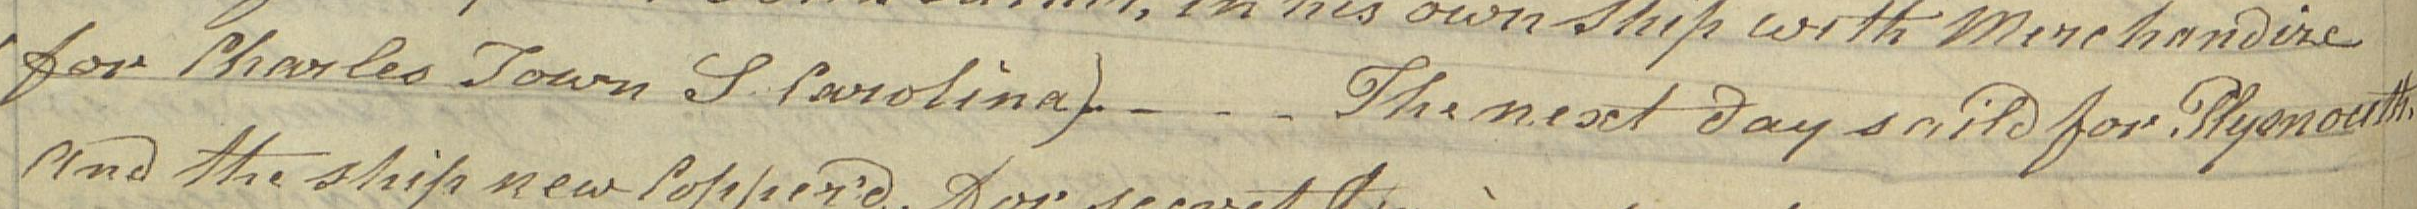for Charles Town S Carolina) The next day saild for Plymouth
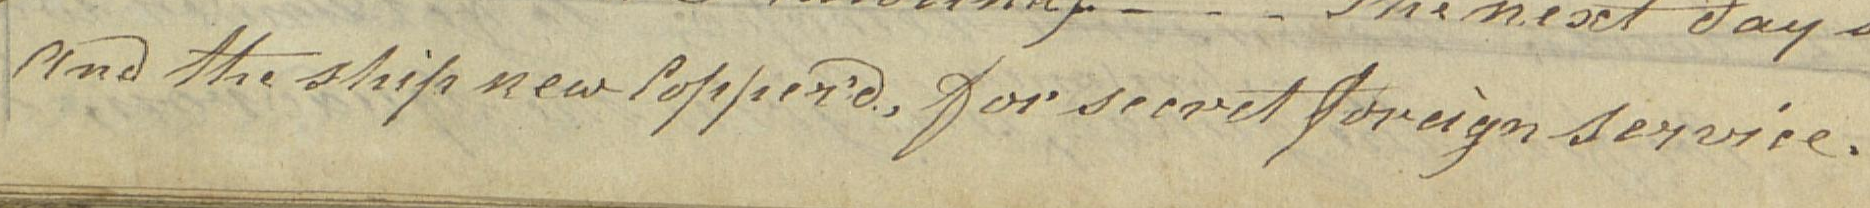and the ship new Copper'd, for secret foreign service.
